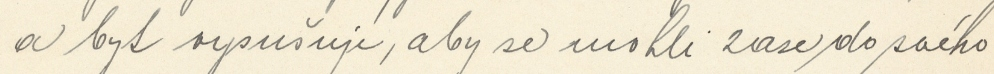a byt vysušují, aby se mohli zase do svého
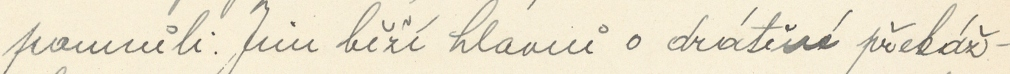pomněli. Jim běží hlavně o drátěné překáž-
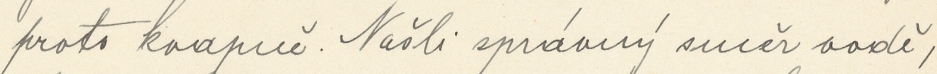proto kvapně. Našli správný směr vodě,
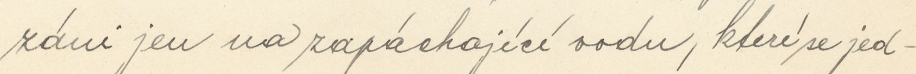záni jen na zapáchající vodu, které se jed-
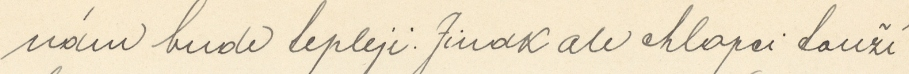nám bude tepleji. Jinak ale chlapci touží
